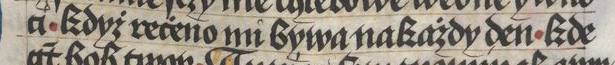ci.když reċeno mi bywa nakażdy den.kde
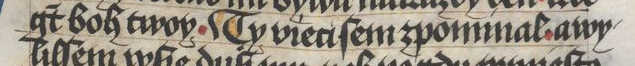ḡt boh twoy.Ty vieci ſem zpomínal.awy¬
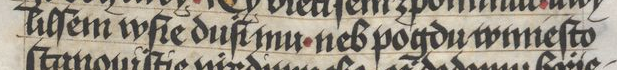lilſem wſie duẛi mu.neb pogdu. wmíeſto
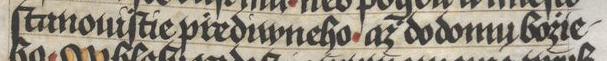ſtunouiẛtie.pṙediwneho.až do domu bożie¬
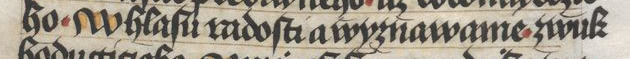ho.Whlaſu radoſti a wyznawanie.zwuk
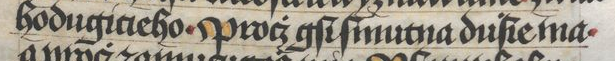hodugícieho.Procż gſi ſmutna duẛie ma.
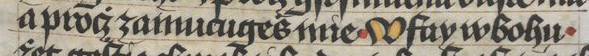a procż zamucugeṡ mie.Vſay w bohu.
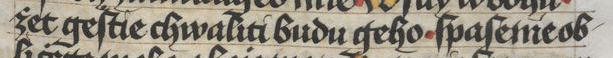żet geẛtie chwaliti budu geho.ſpaſeníe ob¬
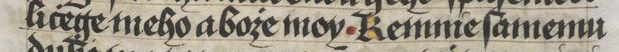liċege meho a boże moy.Kemnie ſamemu
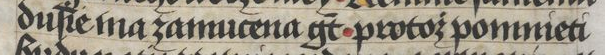duẛie ma zamucena ḡt.protoż pomnieti
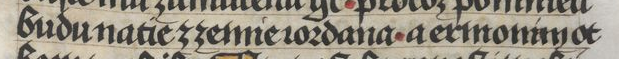budu natie z zemie iordana.a ermoním ot
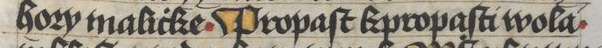hory maličke.Propaſt kpropaſti wolá.
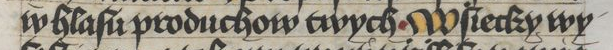w hlaſu produchow twych.Wẛiecky wy¬
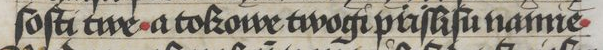ſoſti twe.a tokowe twogi přiẛliſu namie.
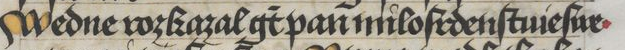Wedne rozkazal ḡt pan miloſrdenſtuíeſwe.
